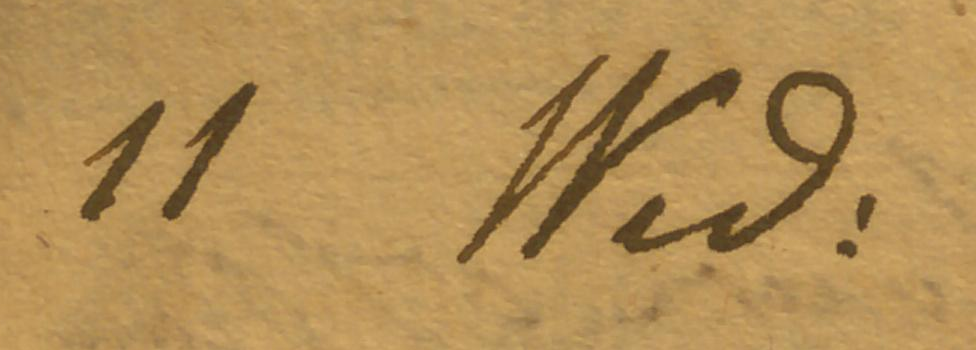11 Wed:
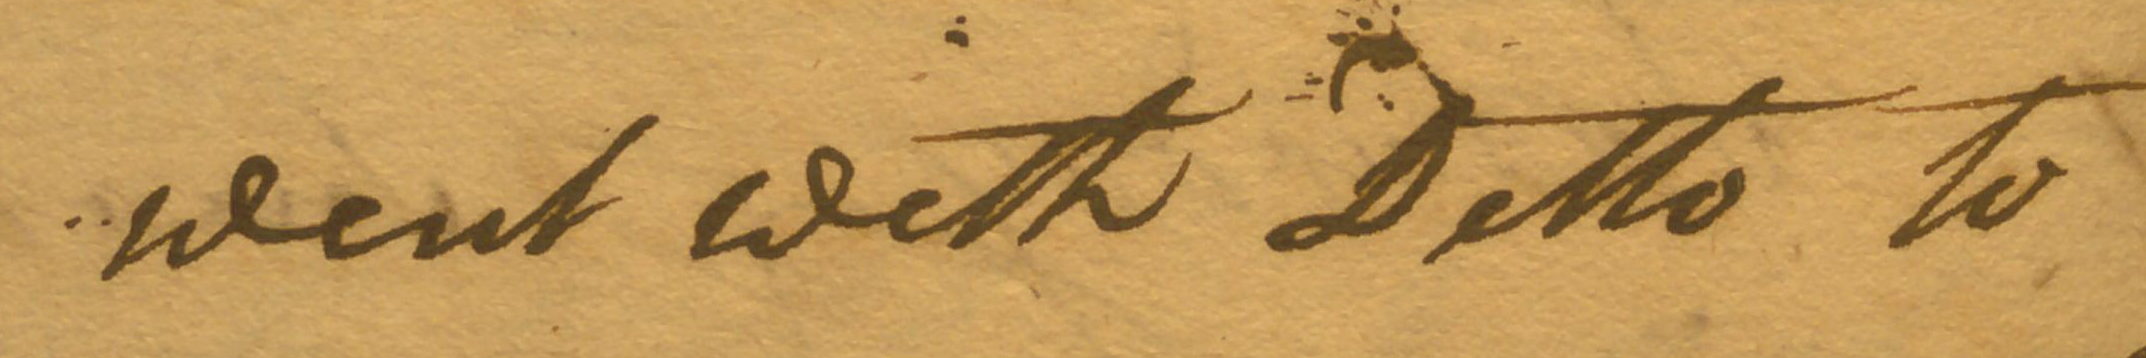went with Ditto to
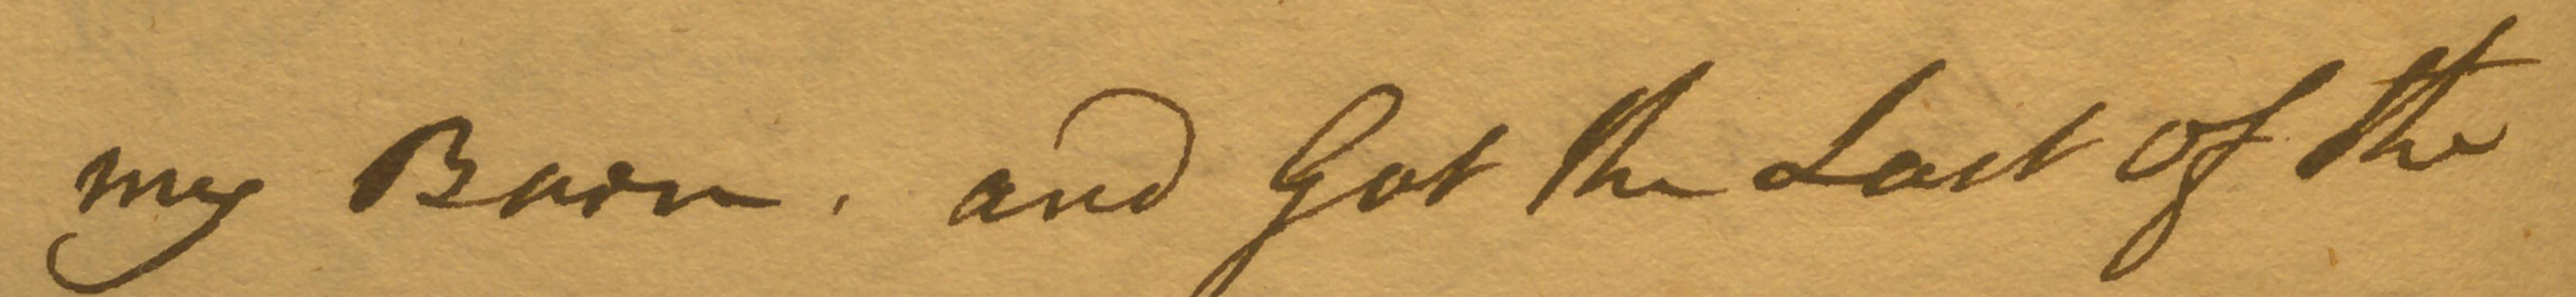my Barn, and Got the Last of the
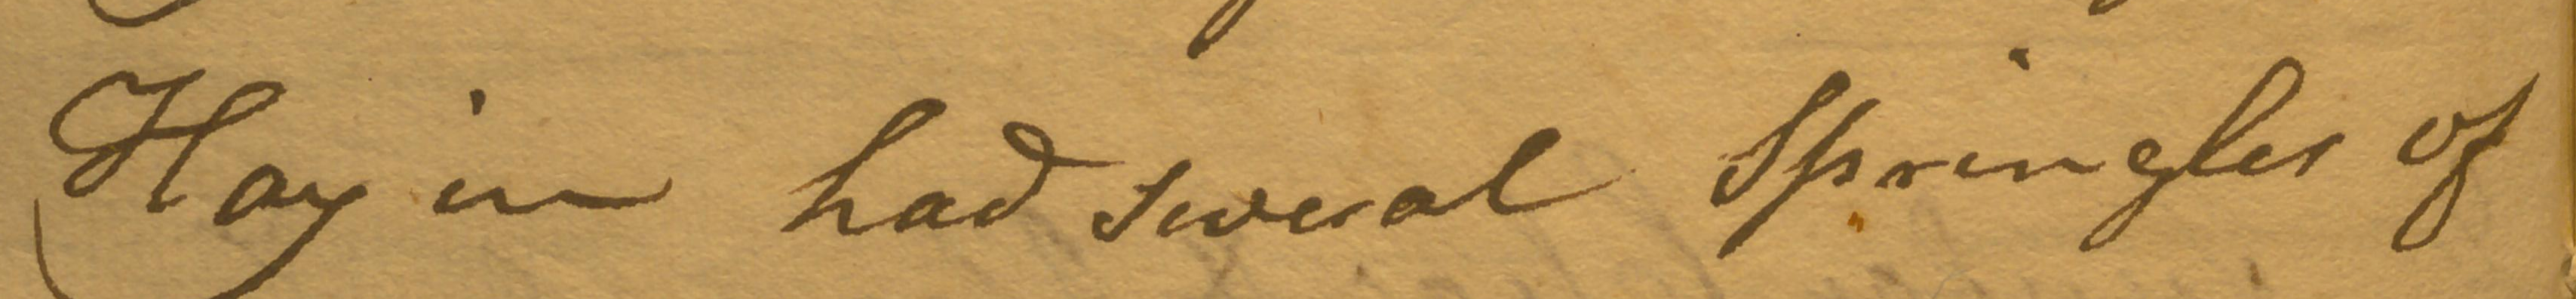Hay in had several Springles of
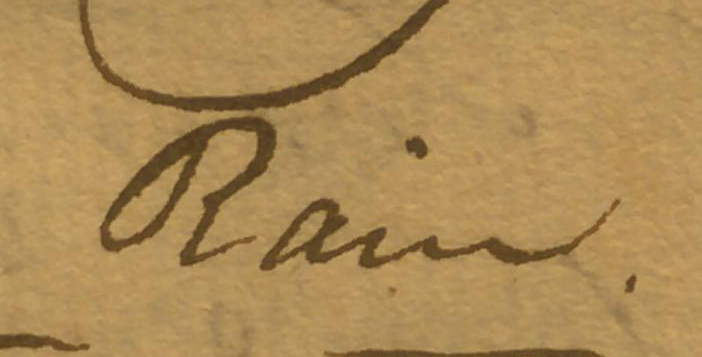Rain
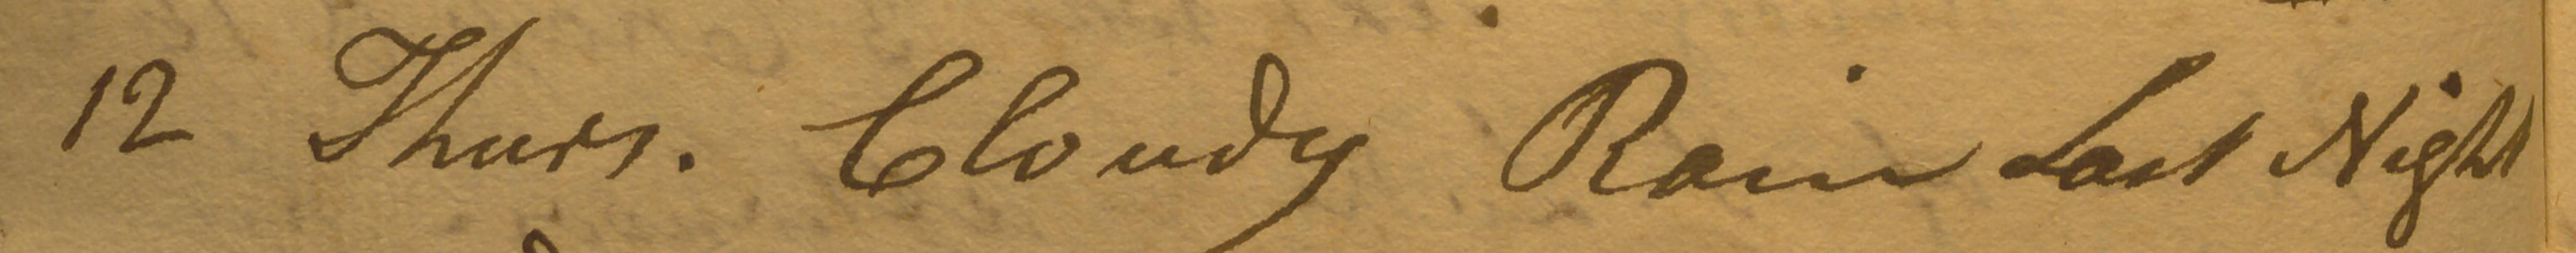12 Thurs. Cloudy Rain Last Night
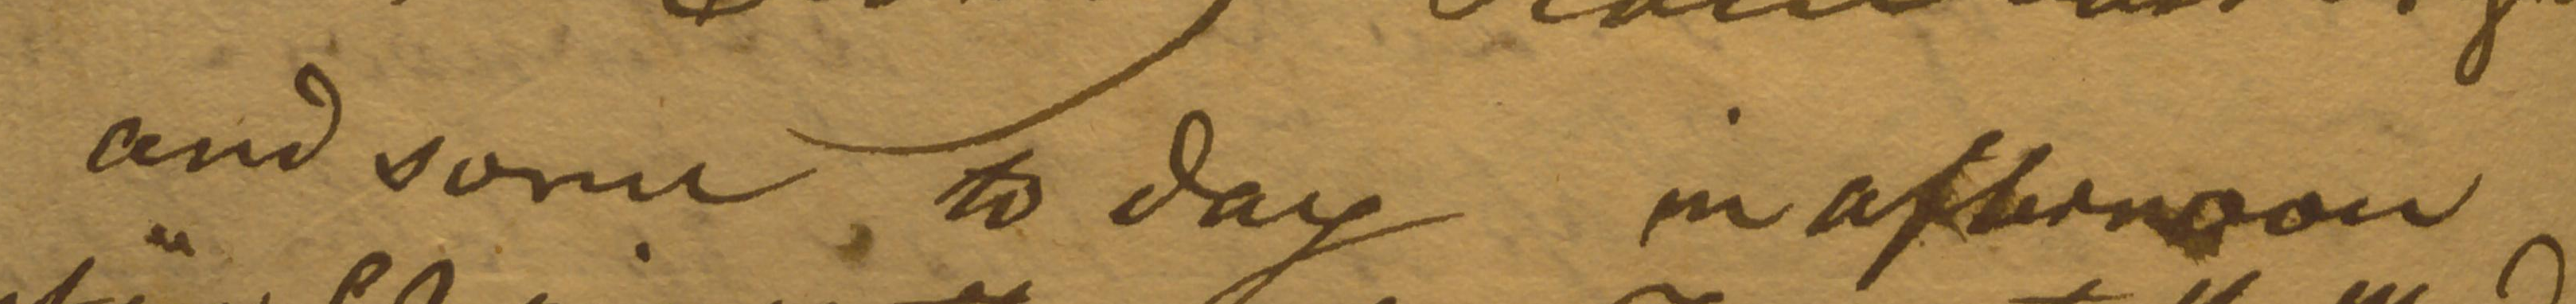and some to day in afternoon
